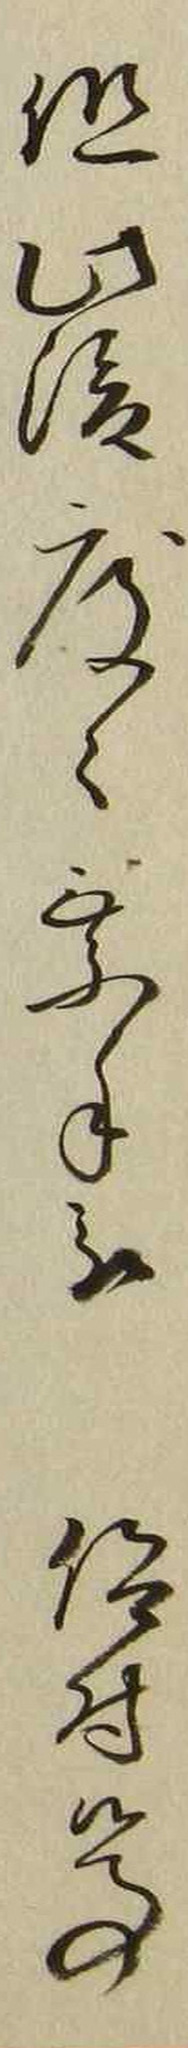但此後度々乗手被仰付候事
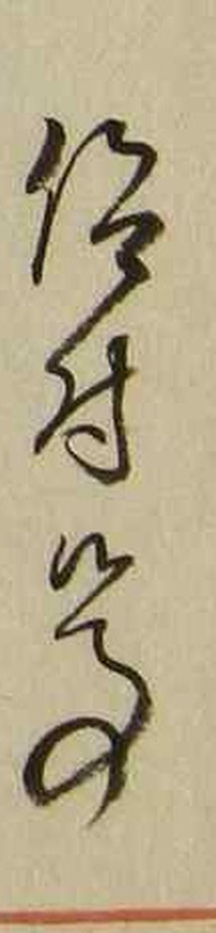仰付候事
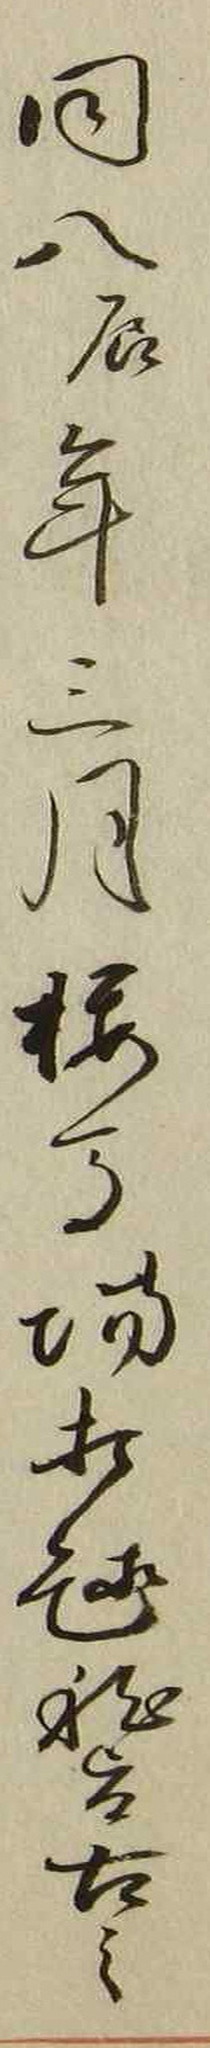同八辰年三月桜馬場打毬稽古之
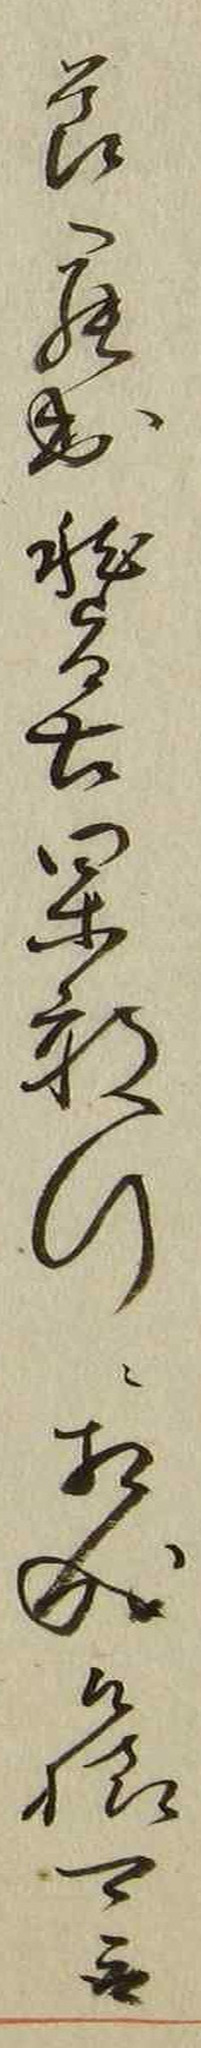節罷出稽古果敢行に相成候様可取
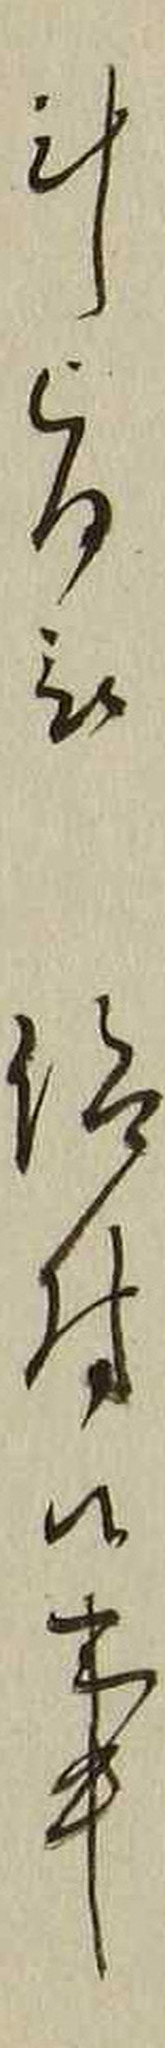計旨被仰付候事
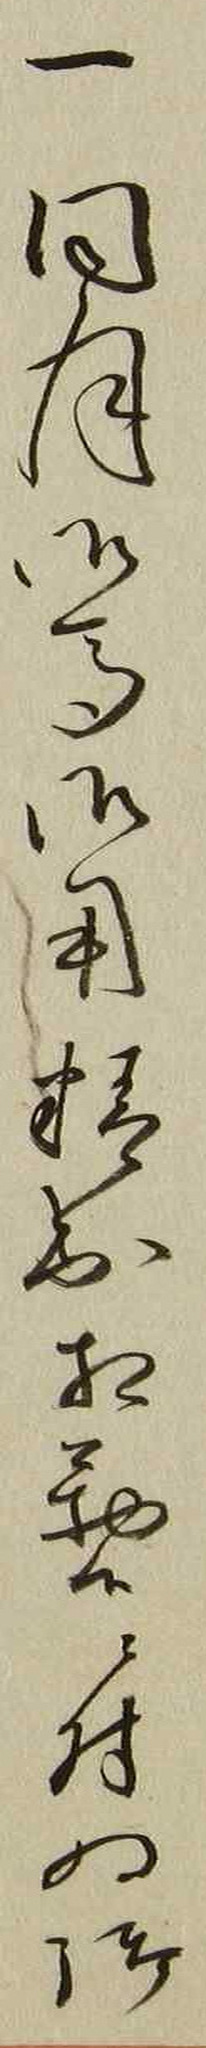一同月御馬御用精出相勤候に付為御
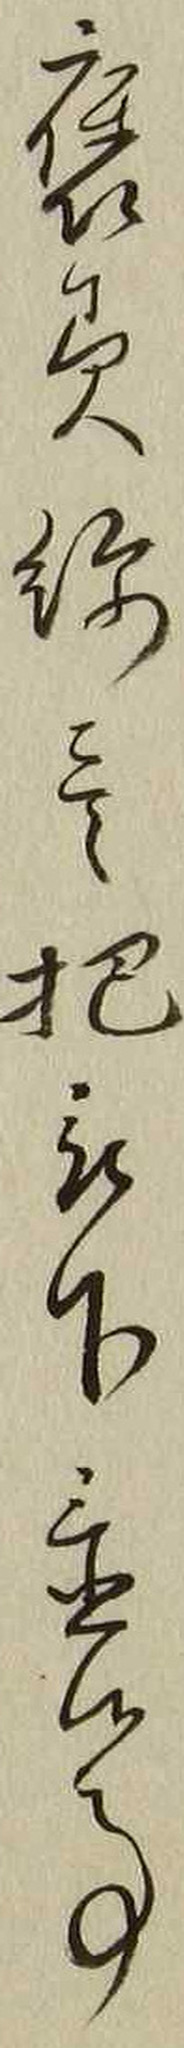褒美綿壱把被下置候事
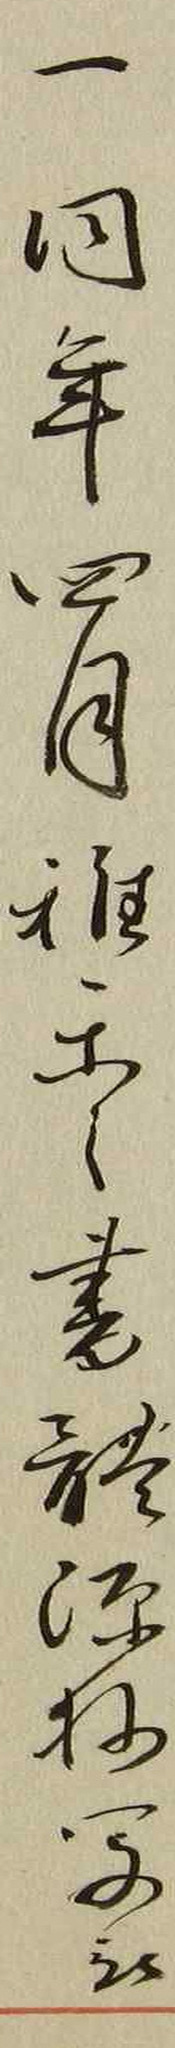一同年四月雅楽之書体源抄写被
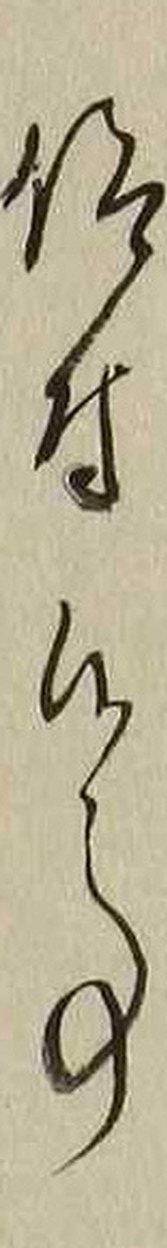仰付候事
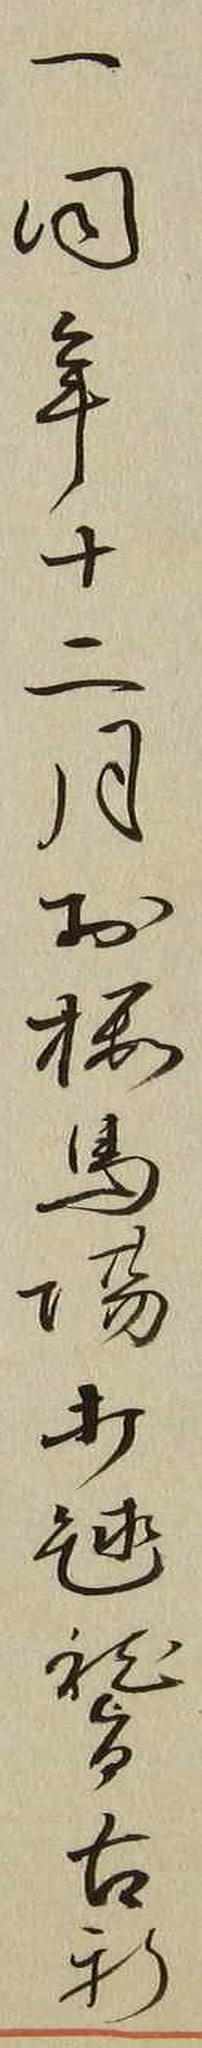一同年十二月於桜馬場打毬稽古新
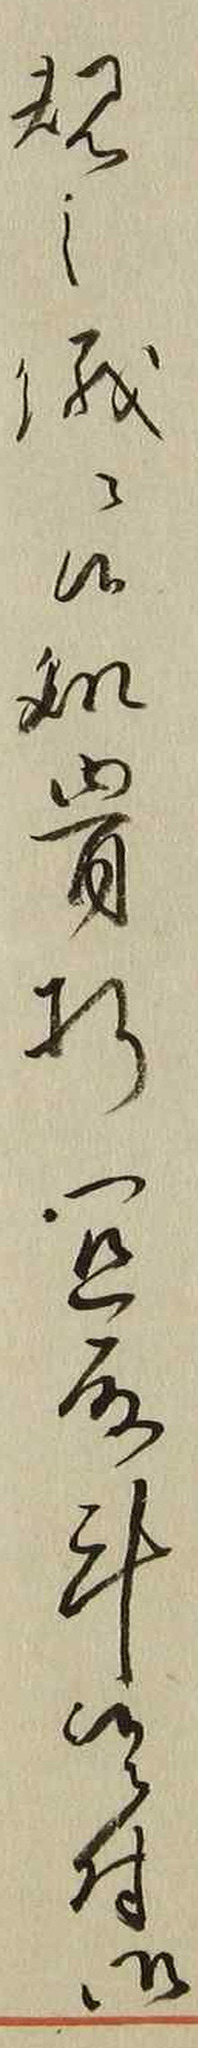規之儀に候処骨折宜取計候に付御
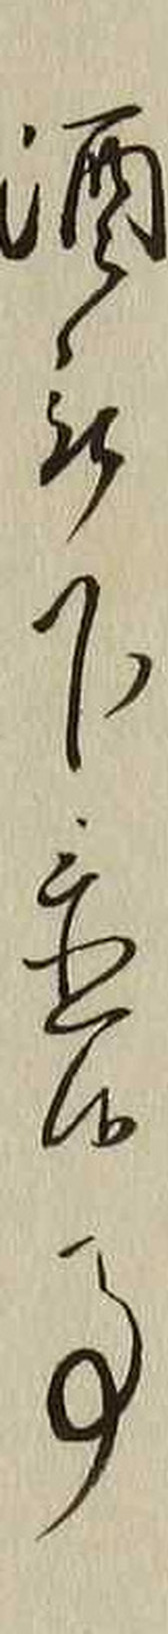酒被下置候事
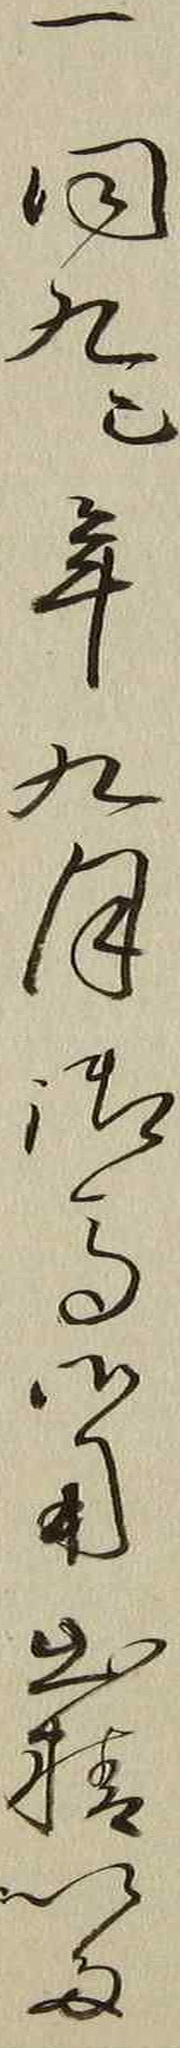一同九巳年九月御馬御用出精いた
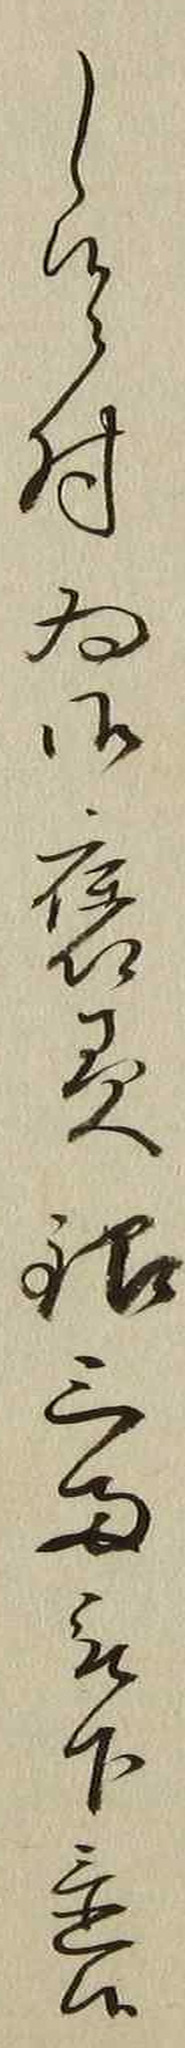し候に付為御褒美銀三両被下置候
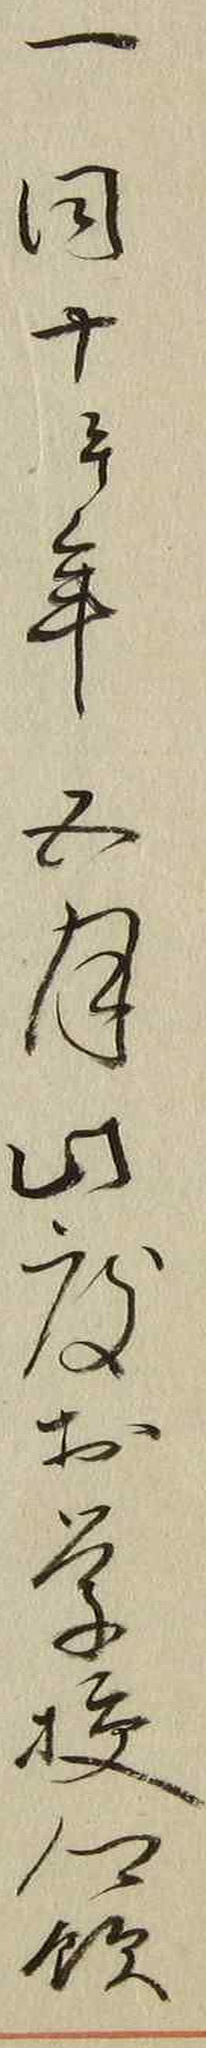一同十午年五月此度於学校郷飲
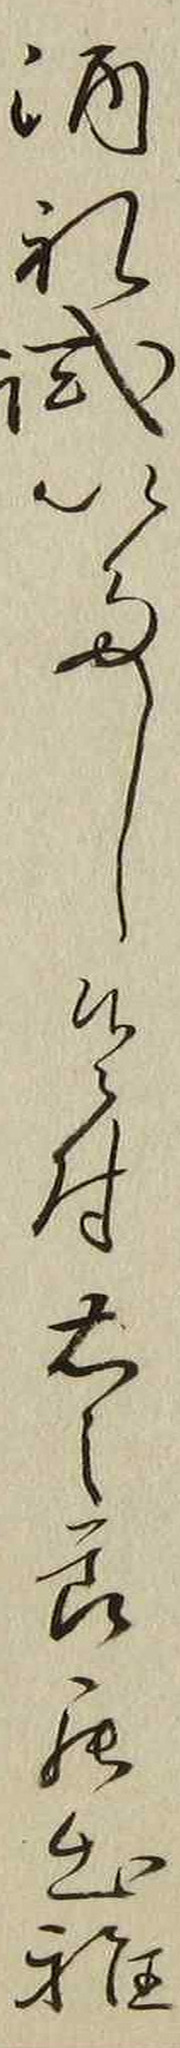酒礼試いたし候に付右之節罷出雅
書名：諸士系譜　巻之3　い之部3
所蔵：会津若松市立会津図書館
